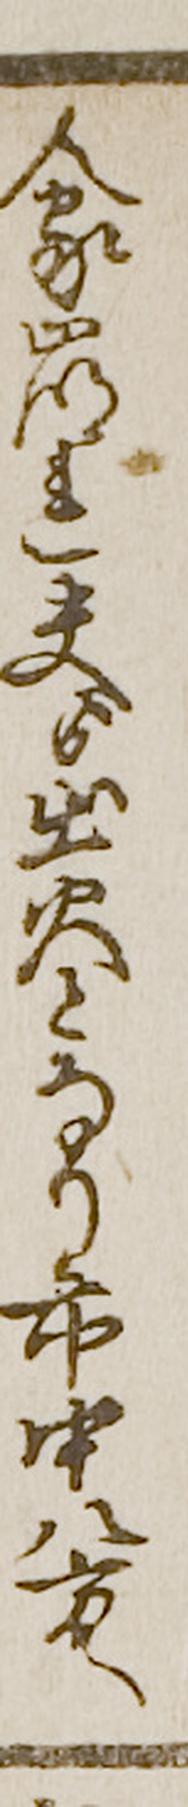人家崩れ夫ゟ出火となり市中八方へ
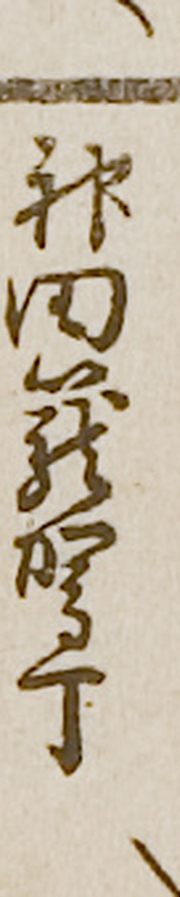神田籠駕丁
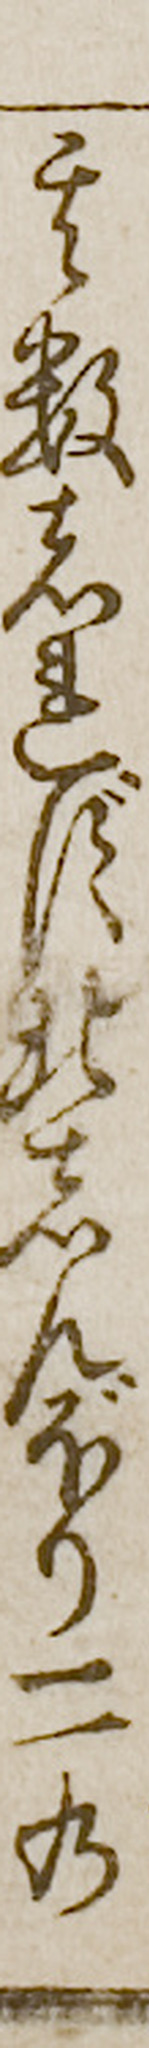其数しれず北しんぼり二の
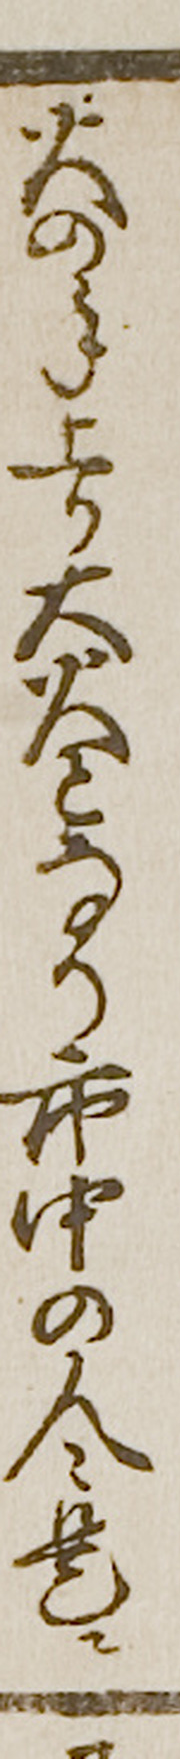火の手上り大火となり市中の人々是に
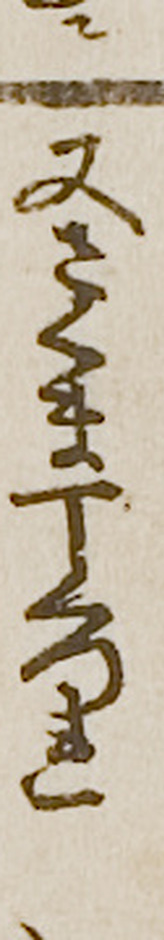又さくま丁くつれ
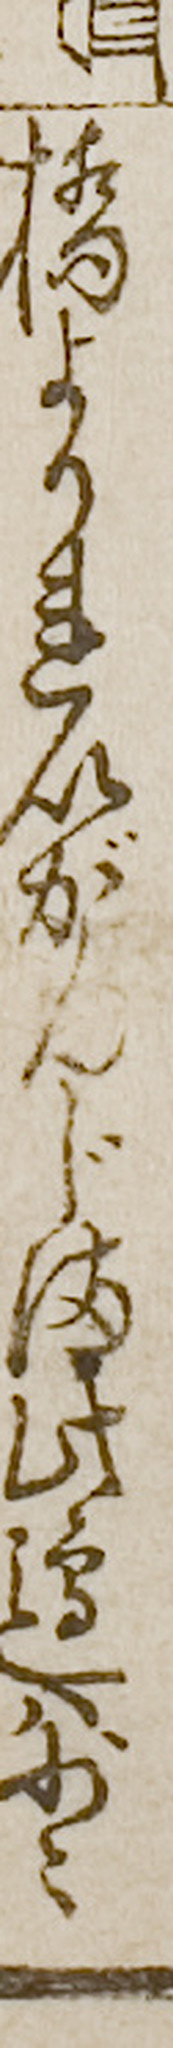橋よりれいがんじま此辺は少々
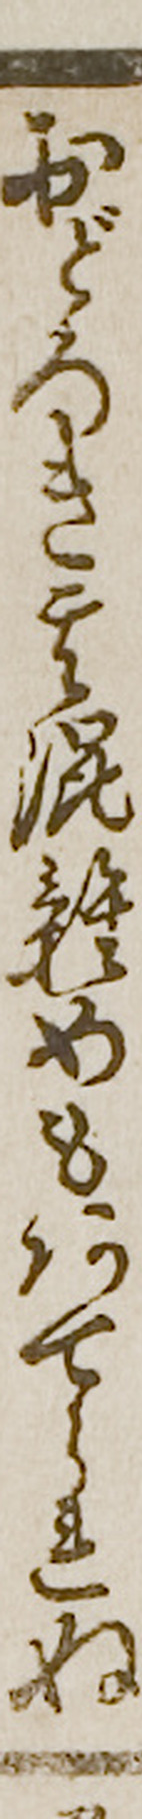おどろき其混雑めもあてられぬ
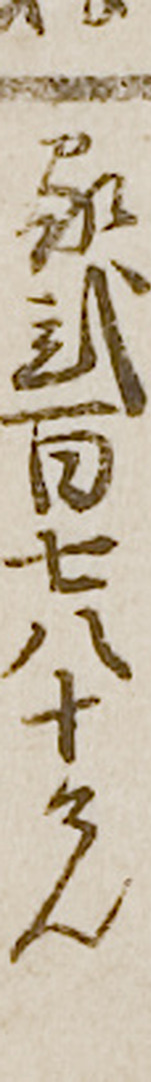家弐百七八十けん
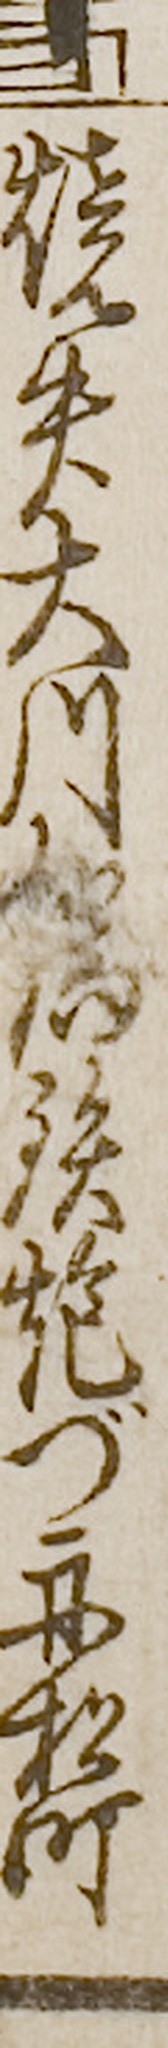焼失大川端鉄砲づ舟松町
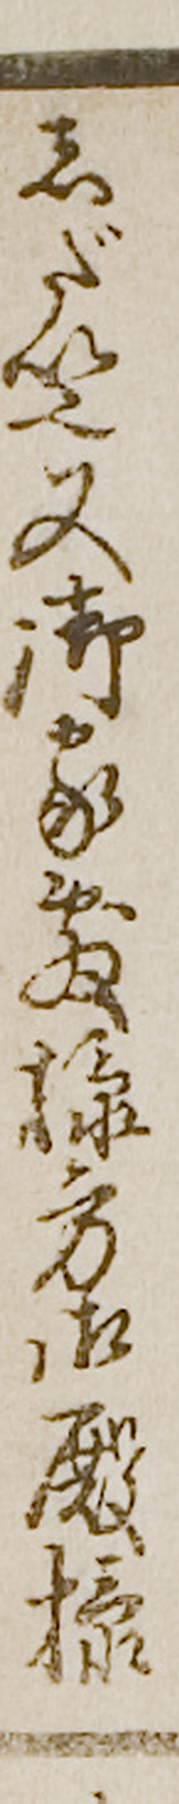しだい也又御屋敷様方御殿様
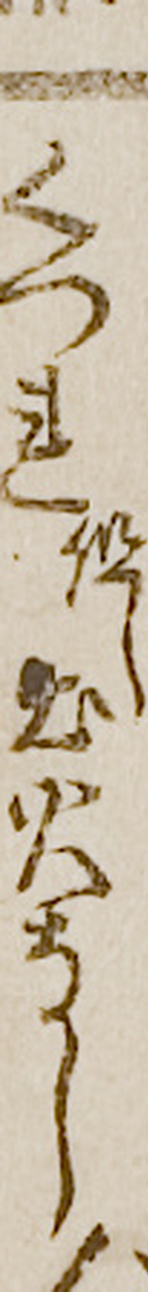くつれ但し出火なし
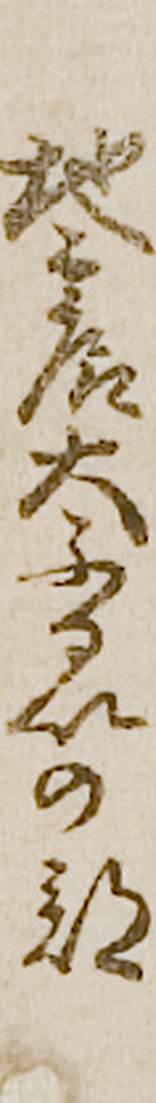地震大ふるいの部
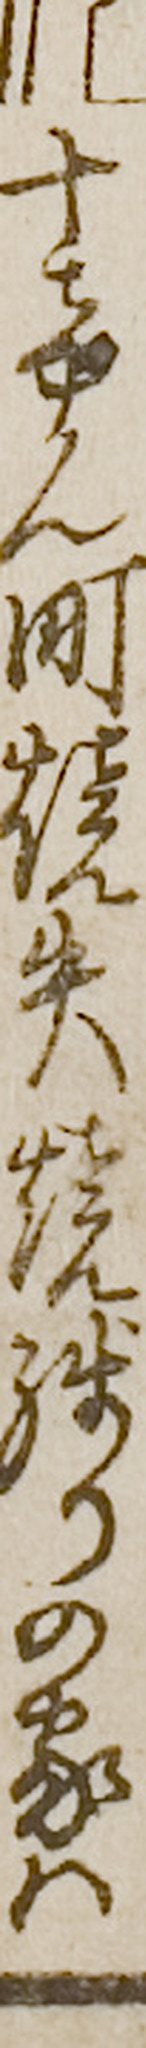十けん町焼失焼残りの家は
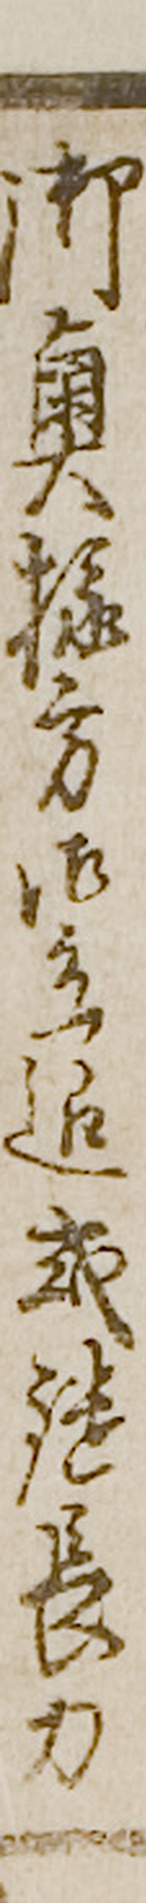御奥様方御立退或鑓長刀
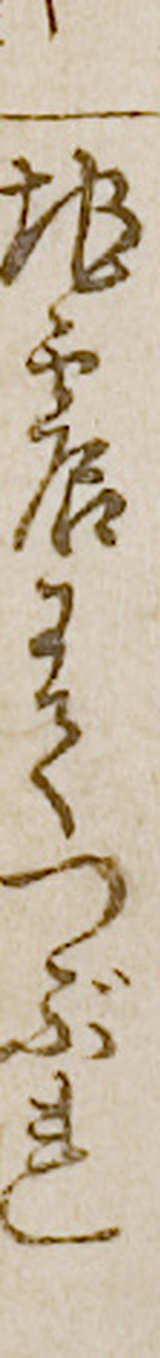地震にてつぶれ
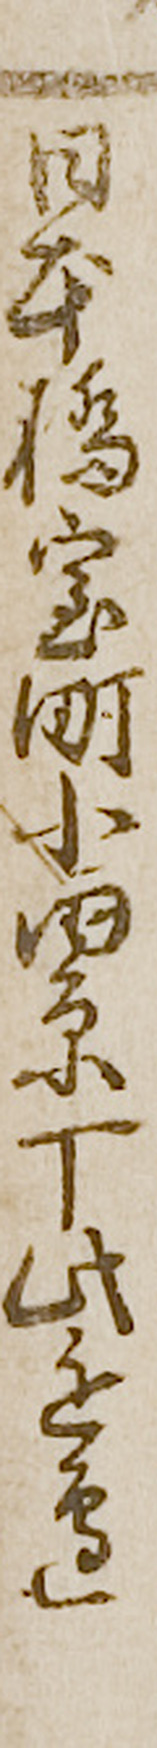日本橋宝町小田原丁此近辺
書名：東都珍事実録咄
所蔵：東京大学総合図書館 General Library in the University of Tokyo, JAPAN
